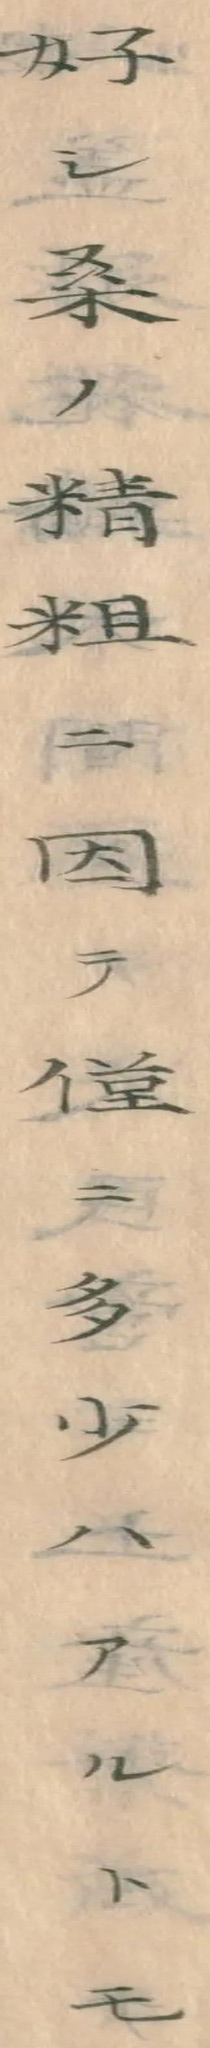好シ桑ノ精粗ニ因テ僅ニ多少ハアルトモ
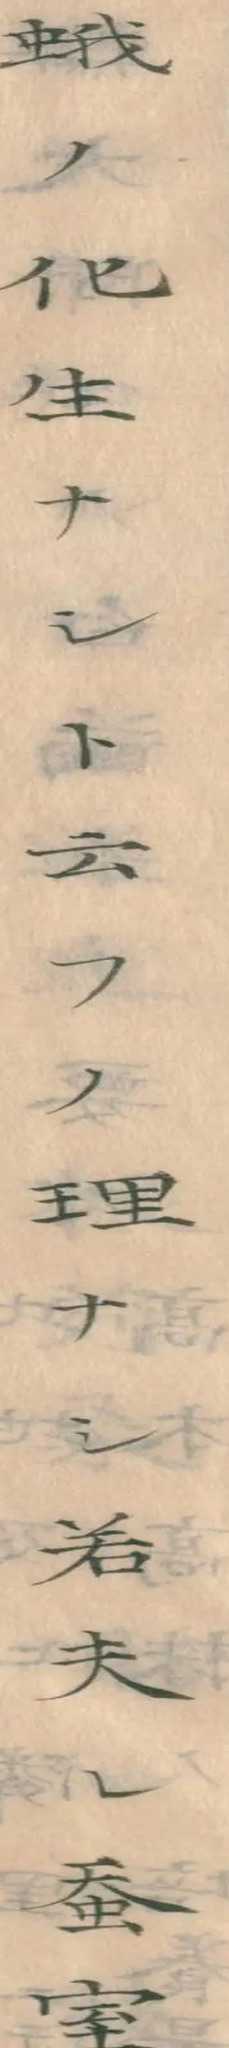蛾ノ化生ナシト云フノ理ナシ若夫レ蚕室
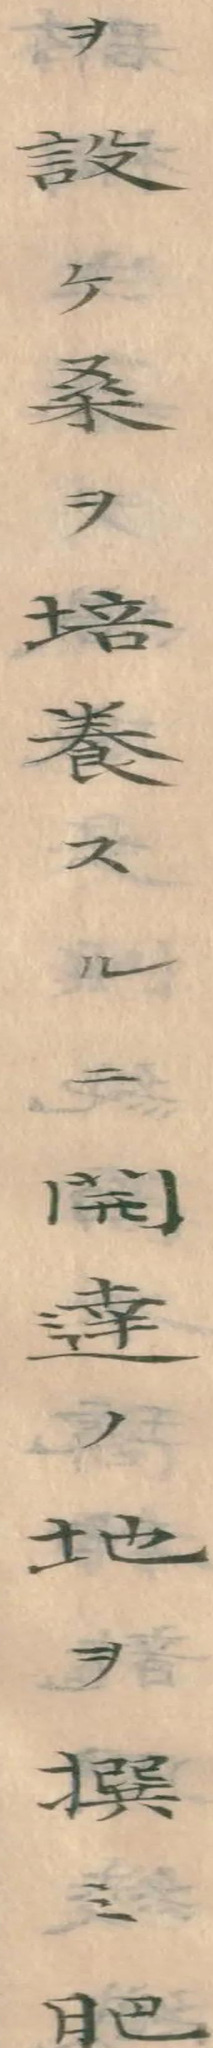ヲ設ケ桑ヲ培養スルニ開達ノ地ヲ撰ミ肥
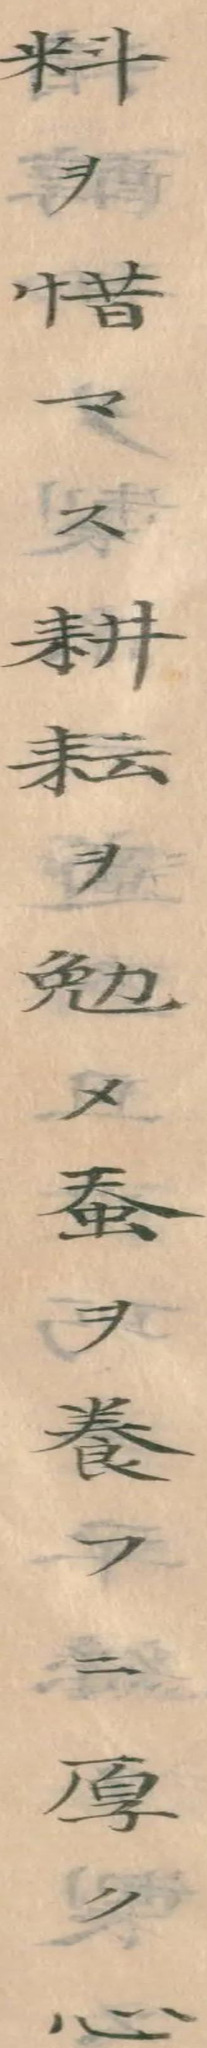料ヲ惜マス耕耘ヲ勉メ蚕ヲ養フニ厚ク心
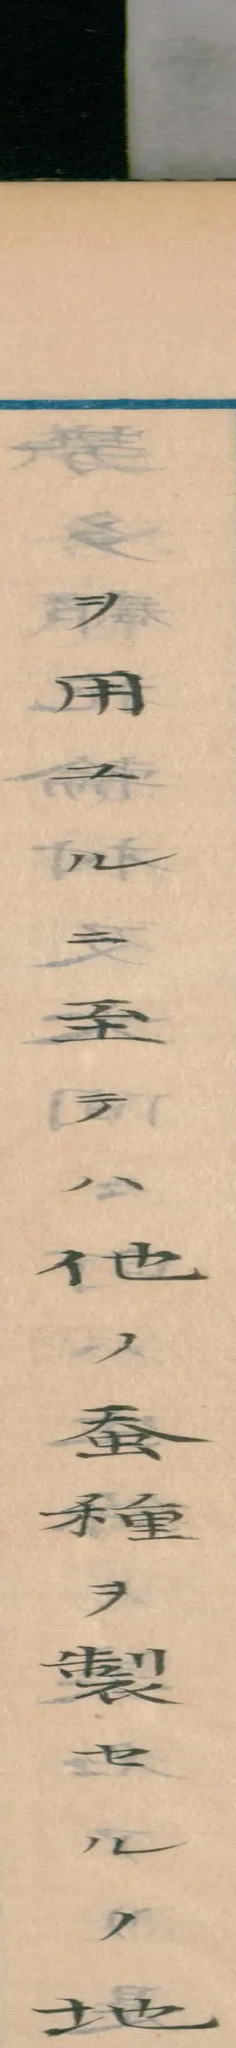ヲ用ユルニ至テハ他ノ蚕種ヲ製セルノ地
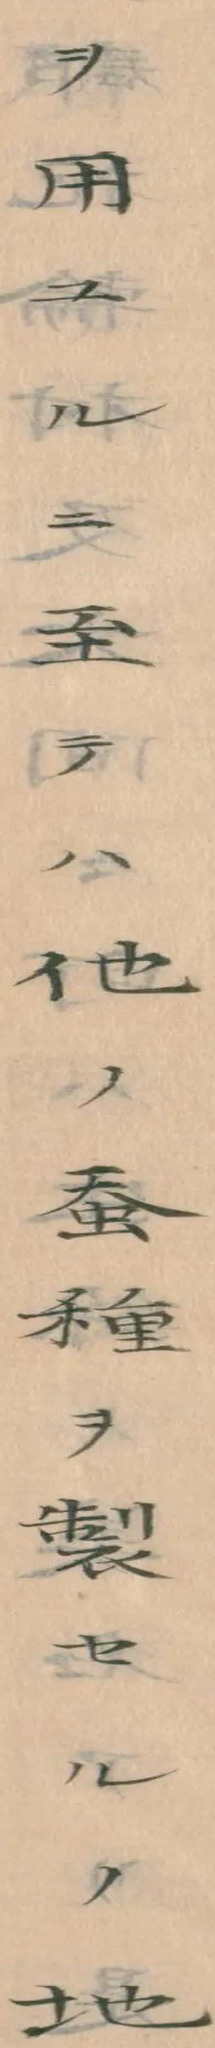ヲ用ユルニ至テハ他ノ蚕種ヲ製セルノ地
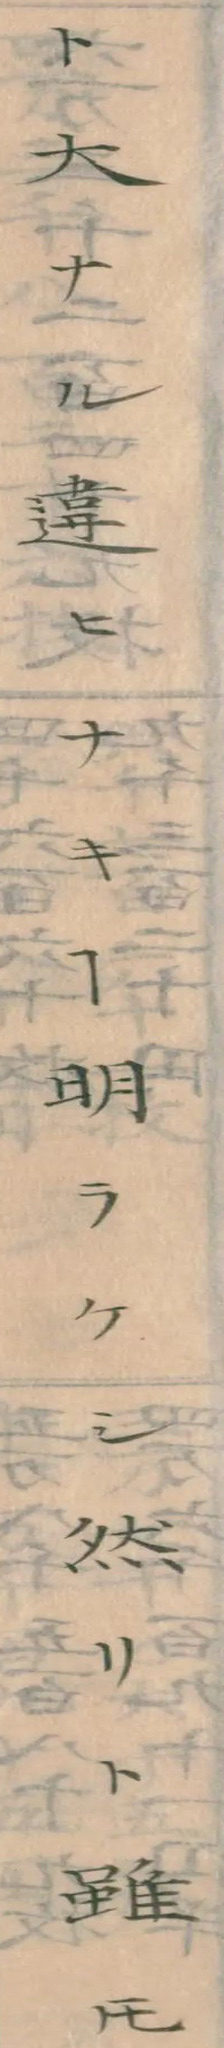ト大ナル違ヒナキコト明ラケシ然リト雖トモ
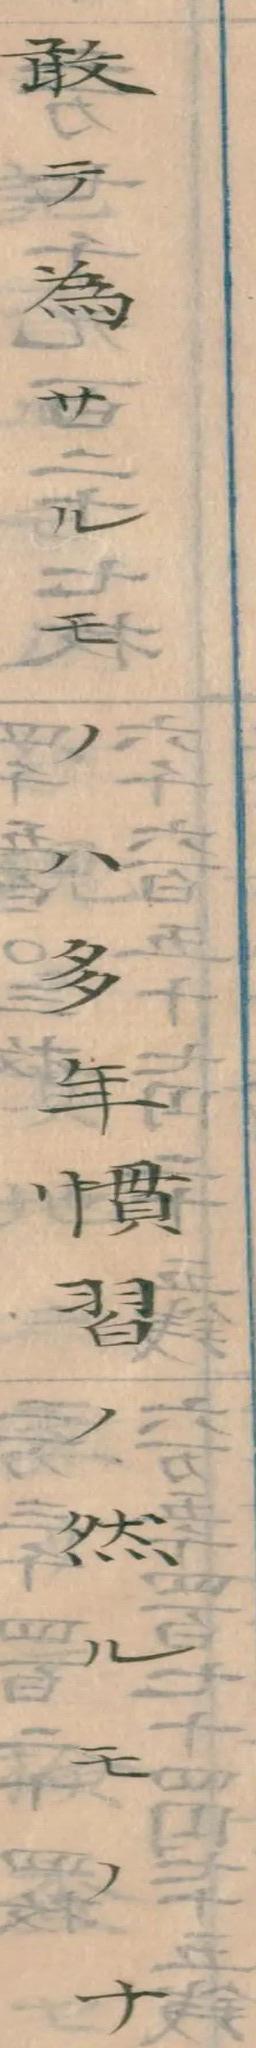敢テ為サルモノハ多年慣習ノ然ルモノナ
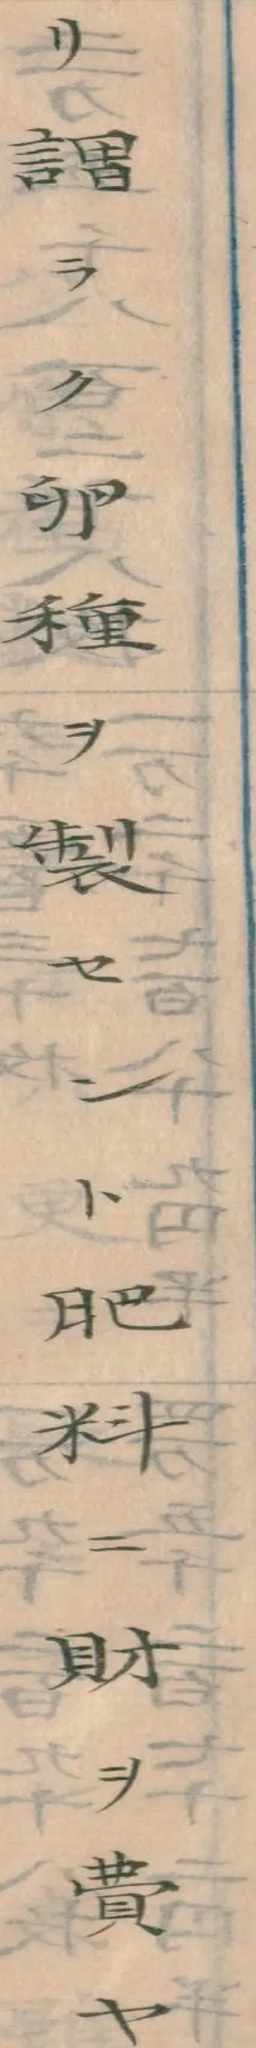リ謂ラク卵種ヲ製セント肥料ニ財ヲ費ヤ
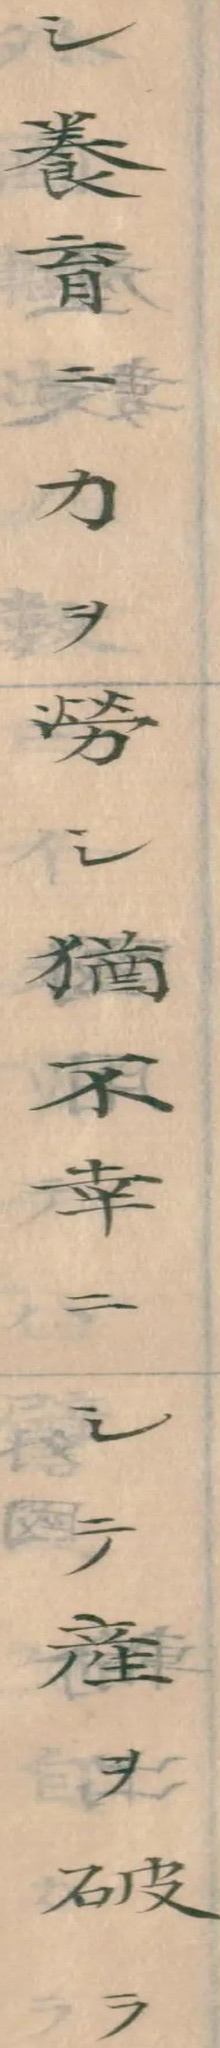シ養育ニ力ヲ労シ猶不幸ニシテ産ヲ破ラ
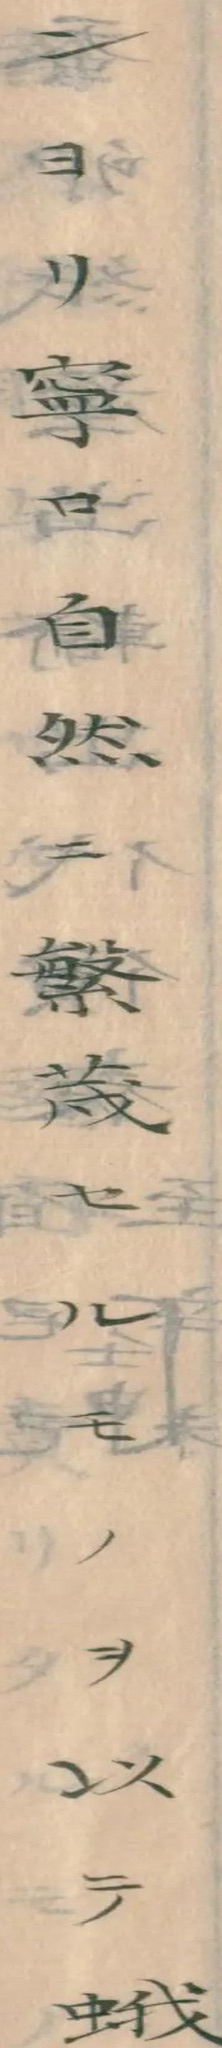ンヨリ寧ロ自然ニ繁茂セルモノヲ以テ蛾
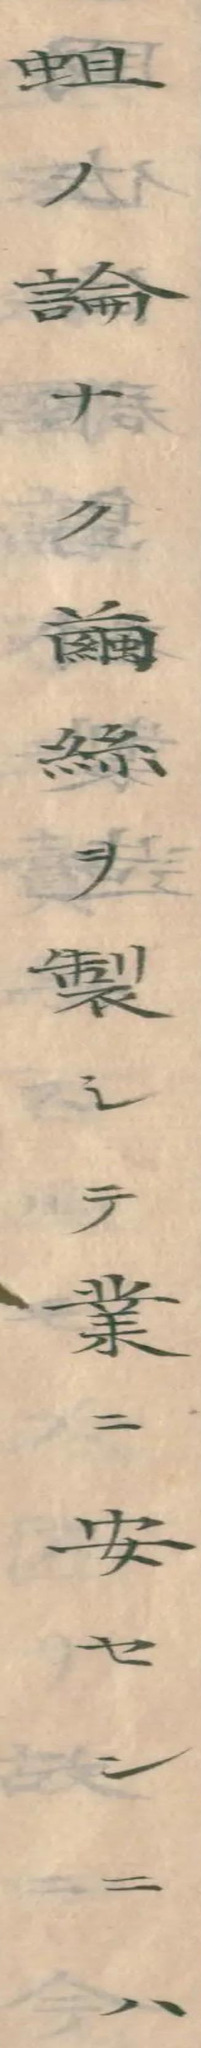蛆之論ナク繭糸ヲ製シテ業ニ安センニハ
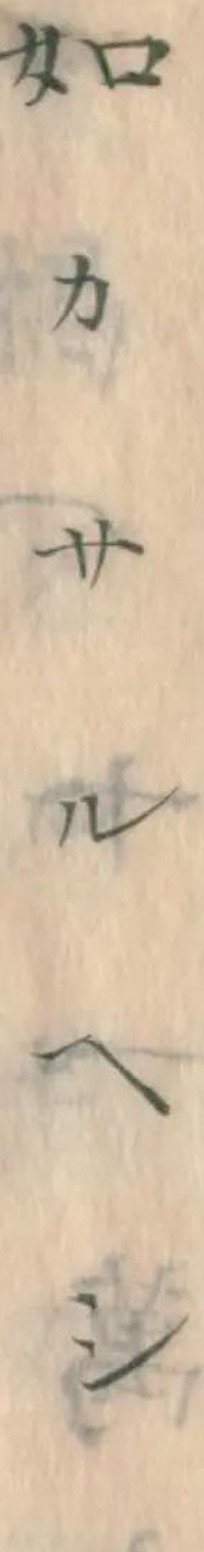如カサルヘシ
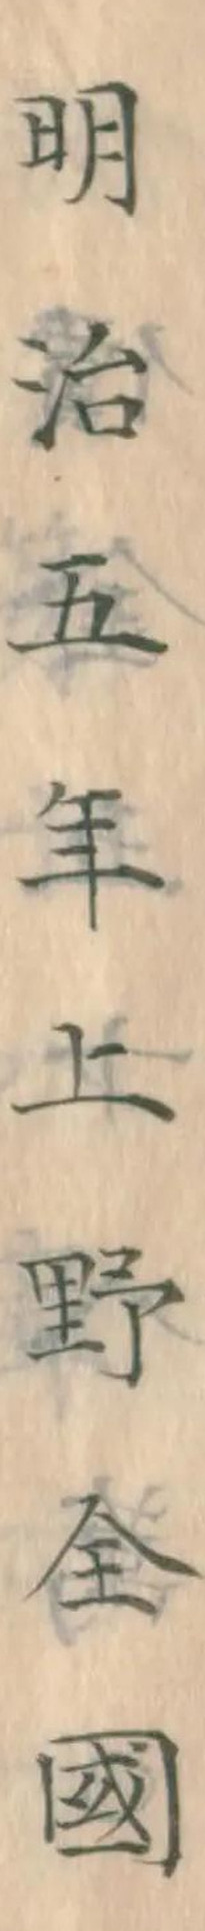明治五年上野全国
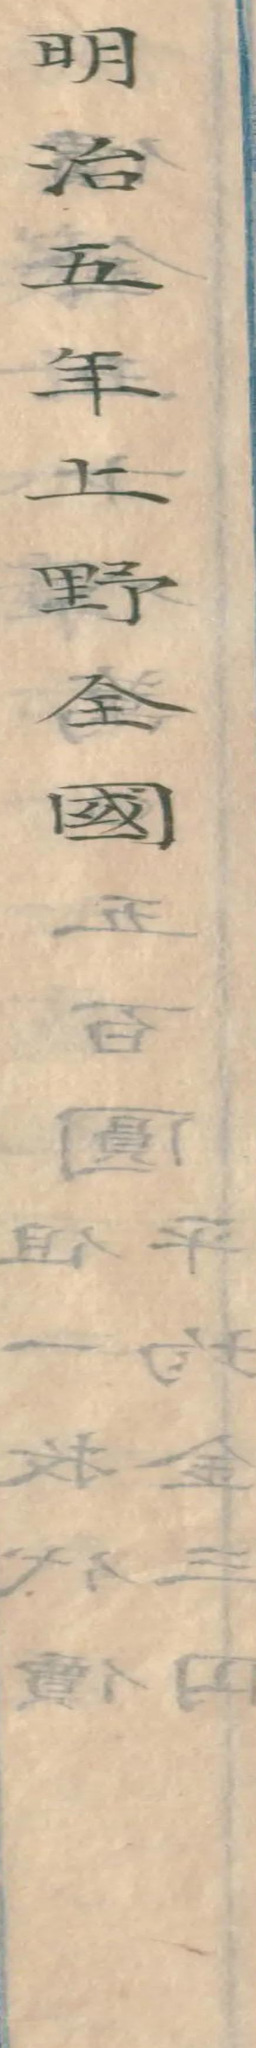明治五年上野全国
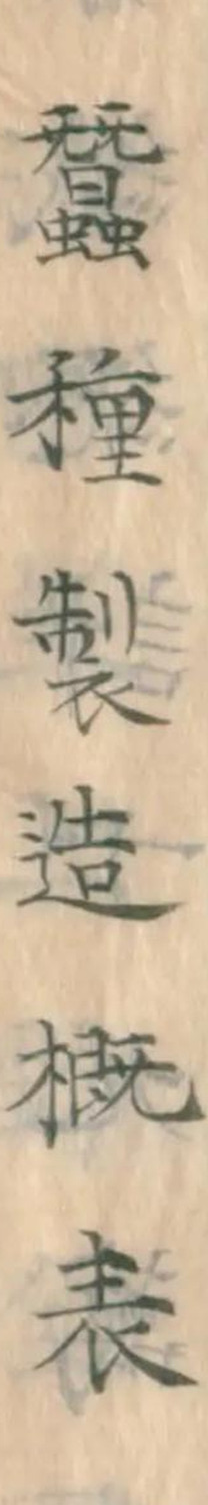蚕種製造概表
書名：蚕桑集成
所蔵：国立国会図書館 National Diet Library, JAPAN
